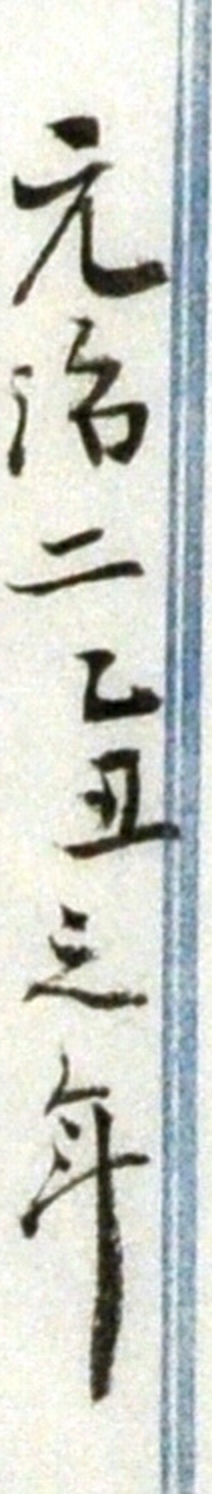元治二乙丑之年
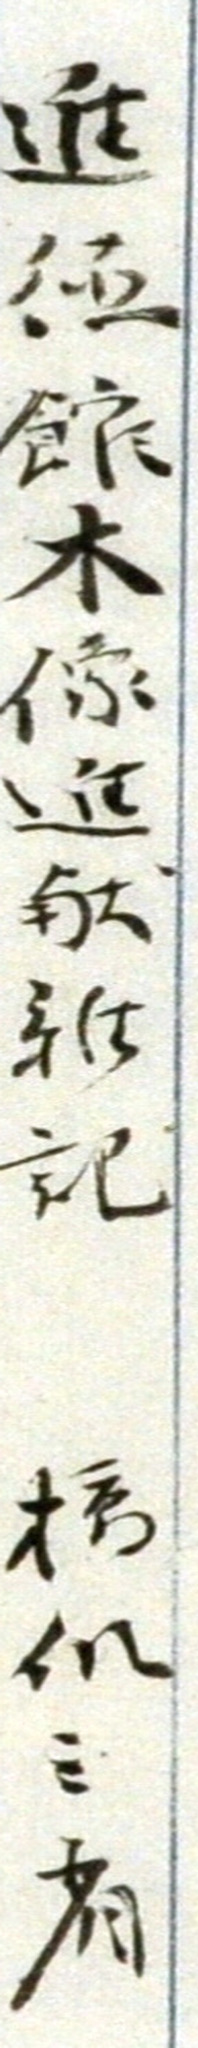進徳館木造進献雑記橋爪三省
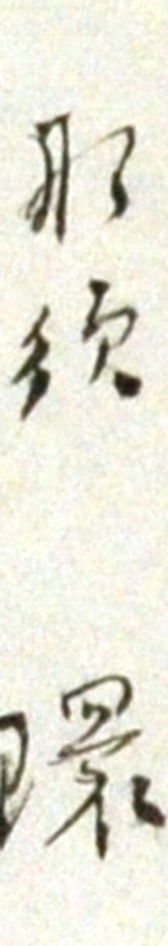那須環
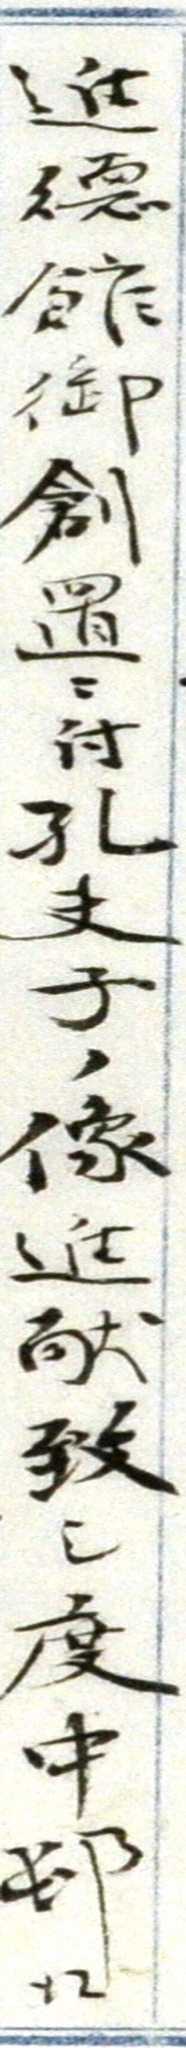進徳館御創置ニ付、孔夫子ノ像進献致シ度、中邨江
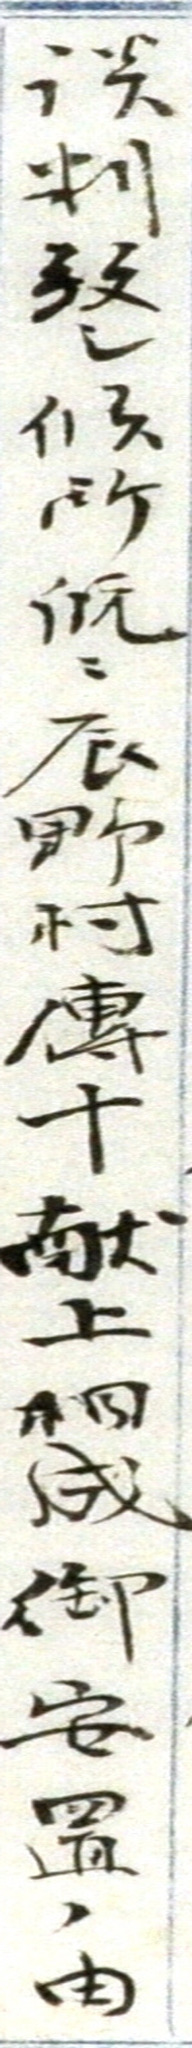談判致シ候所、既ニ辰野村伝十献上相成、御安置ノ由
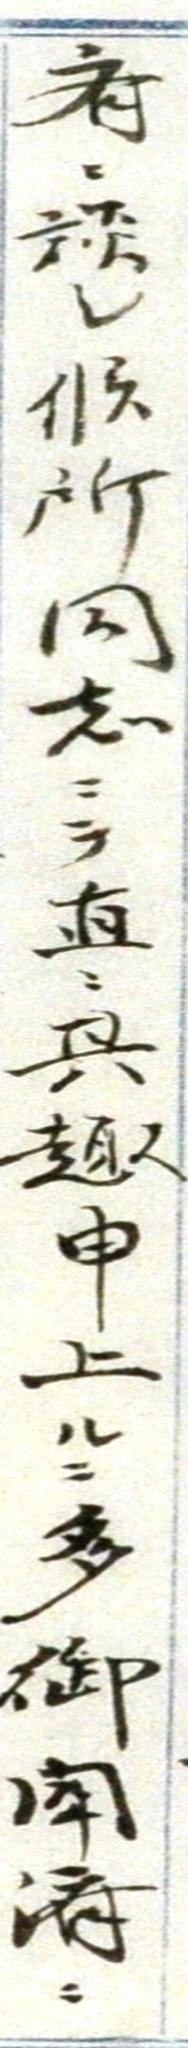斎ニ談シ候所、同志ニテ直ニ其趣申上ルニ多、御聞済ニ
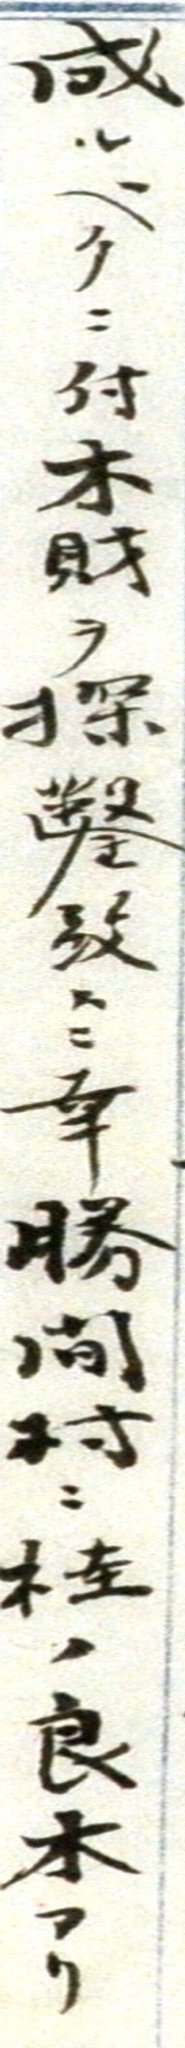成ルベクニ付、木財ヲ探鑿致スニ、幸、勝間村ニ桂ノ良木アリ
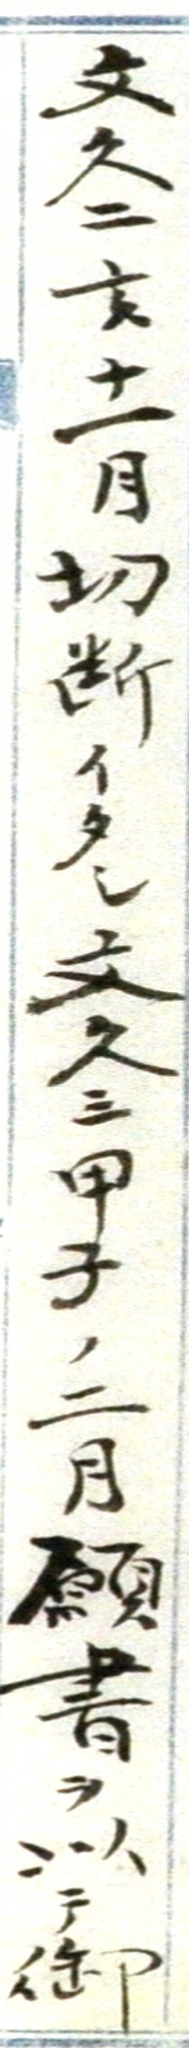文久二亥十一月切断イタシ、文久三甲子ノ二月、願書ヲ以テ御
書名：進徳館木像進献雑記
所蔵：伊那市立高遠町図書館・合同会社AMANE
